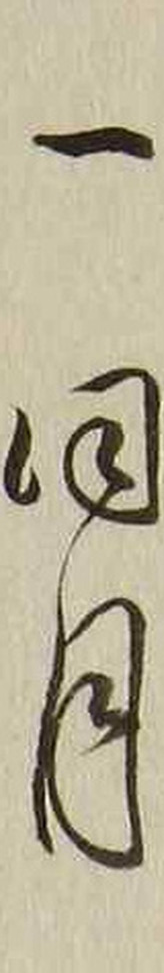一同月
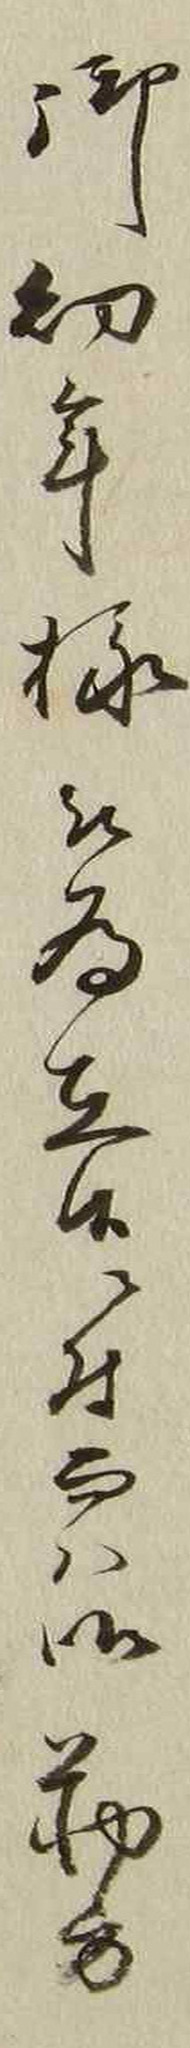御幼年様被為在候ニ付而ハ御勤方
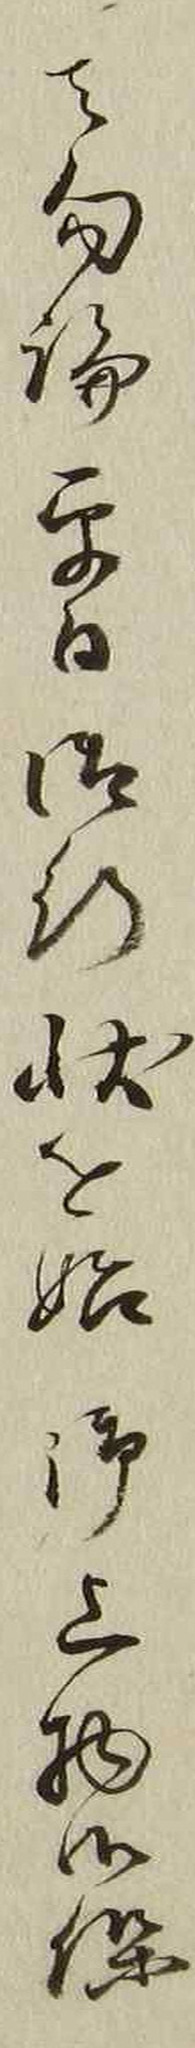者勿論平日御行状を始御上物御保
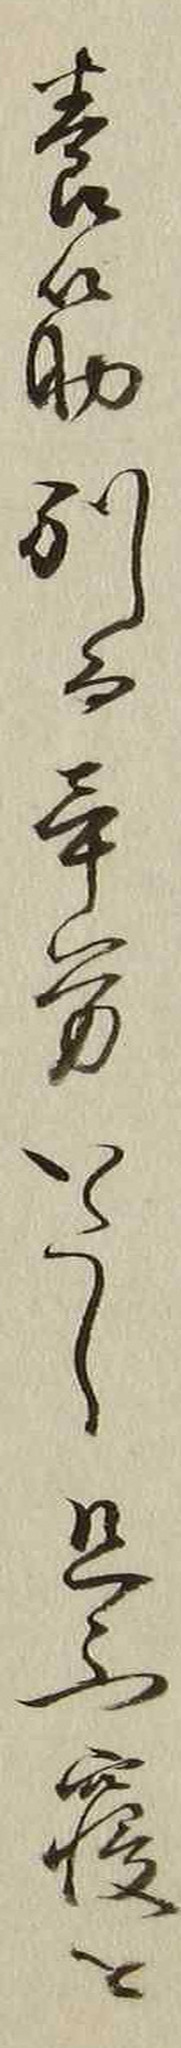養筋別而辛労いたし旦不寝を
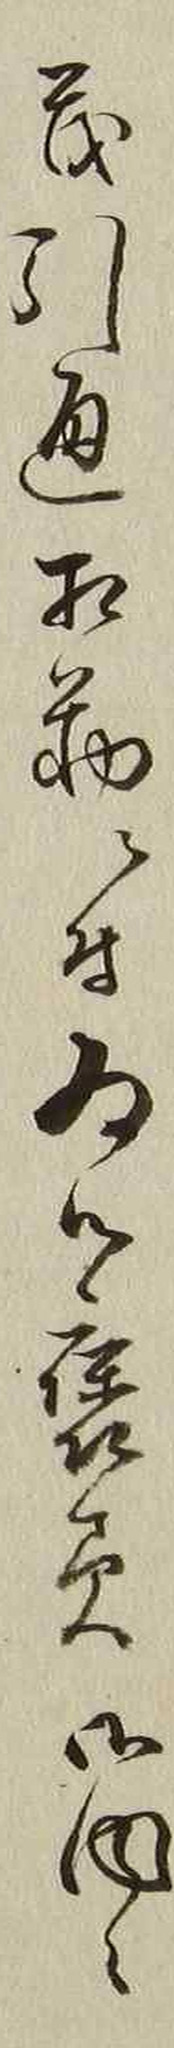茂引通相勤ニ付為御褒美御内々
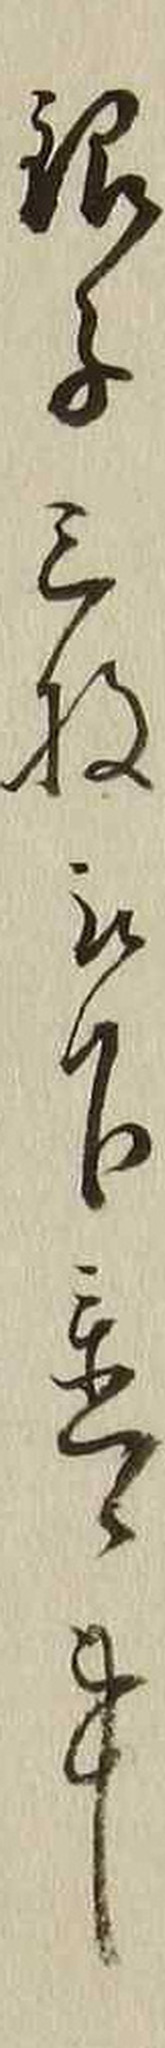銀子三枚被下置候事
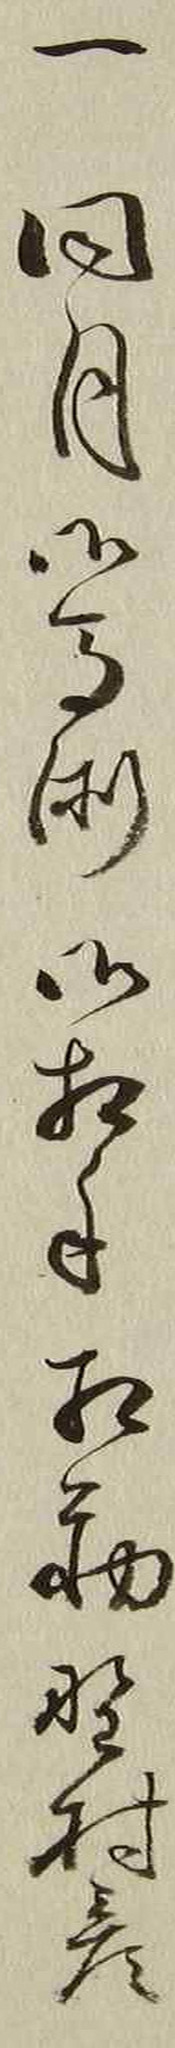一同月御馬術御相手相勤野村彦
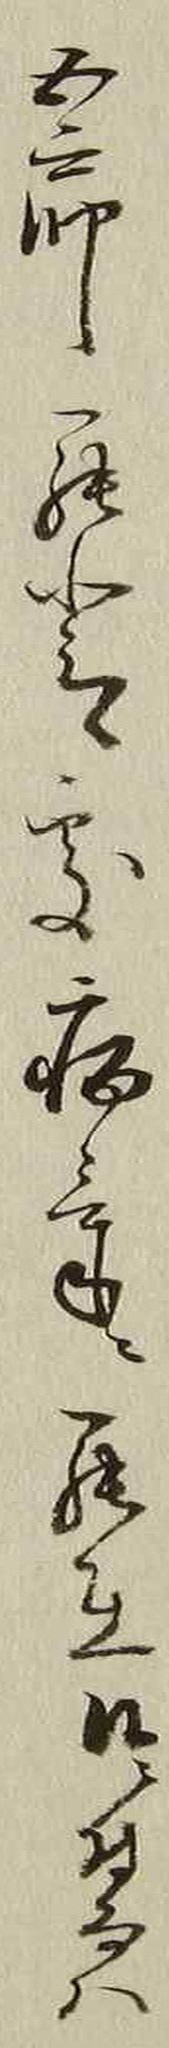五郎罷登候処病気ニ罷在御候ニ付而ハ
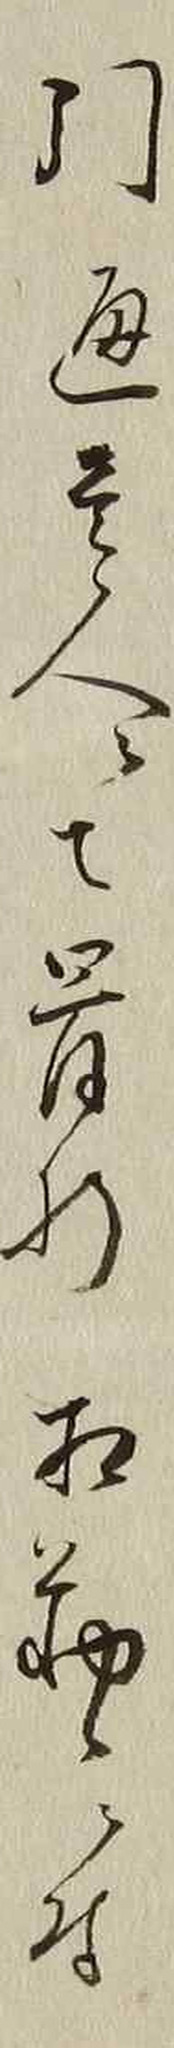引通壱人ニて骨折相勤候ニ付
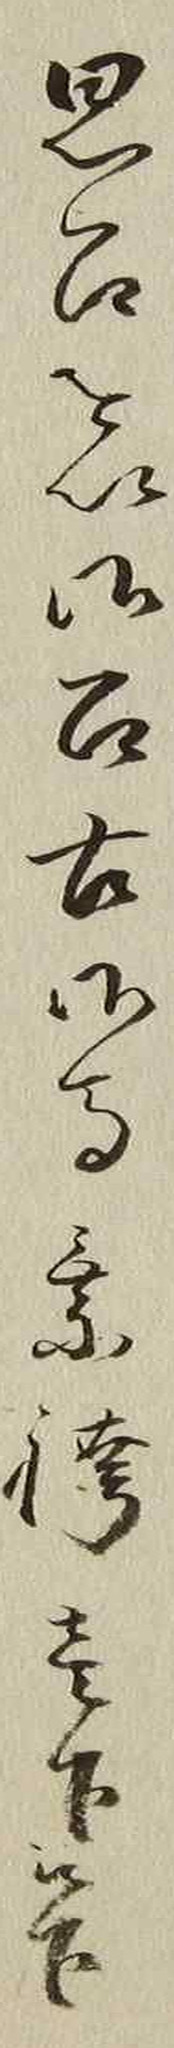思召を以御召古御馬乗袴壱下被下
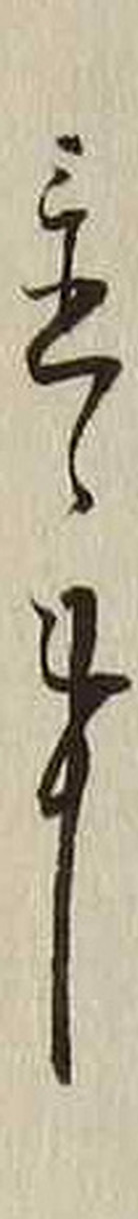置候事
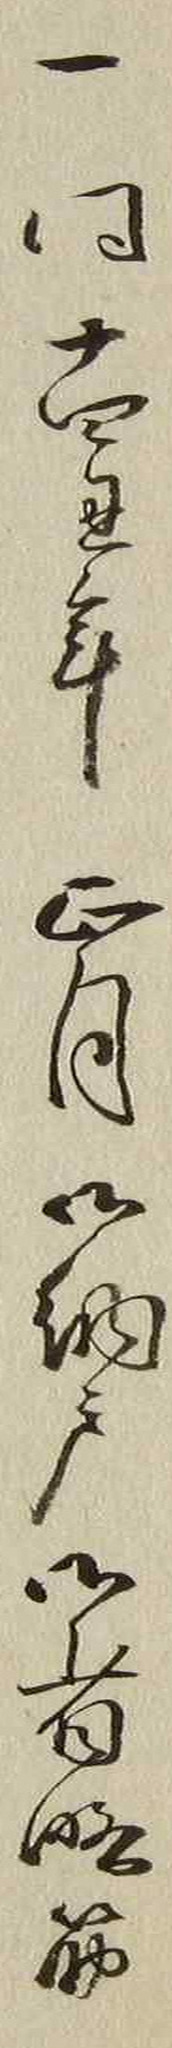一同十四丑年正月御納戸御省略筋
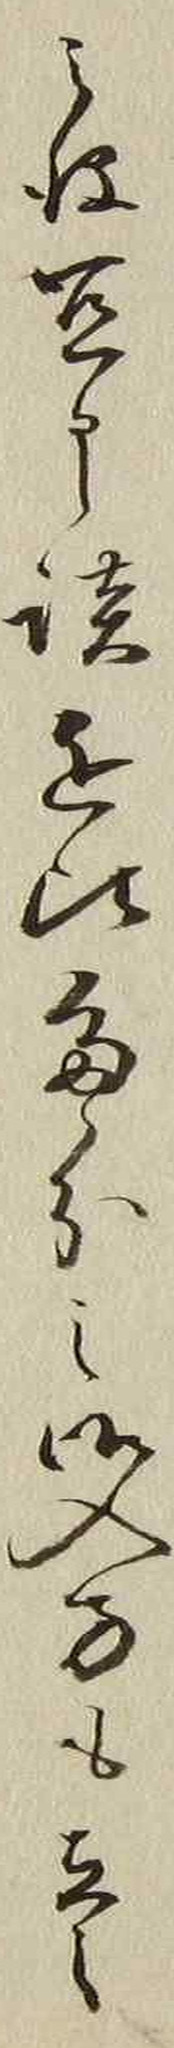之儀宜申談近比多分之御入方も在之
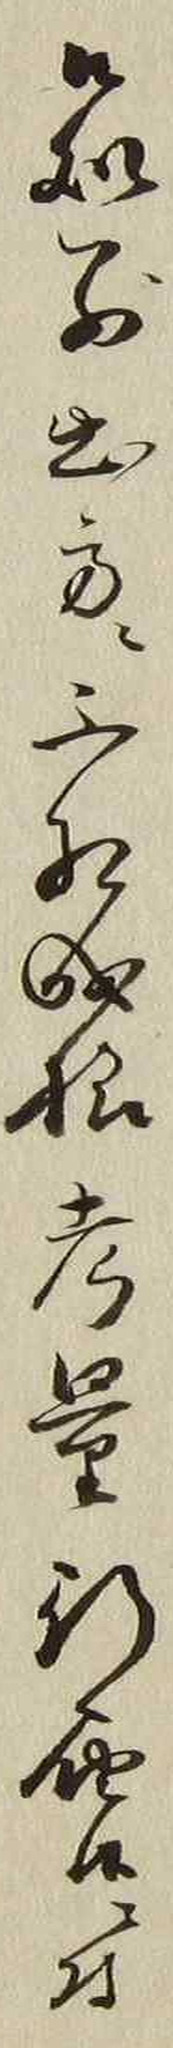候処別出方ニ不相成様考量行届候ニ付
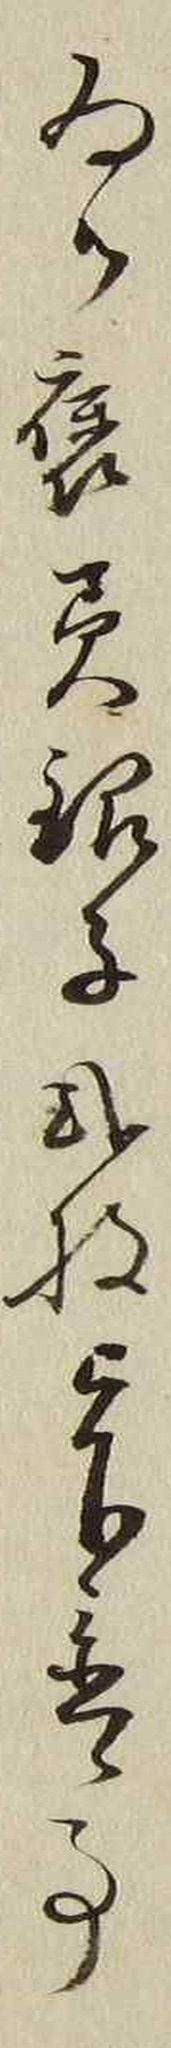為御褒美銀子弐枚被下置候事
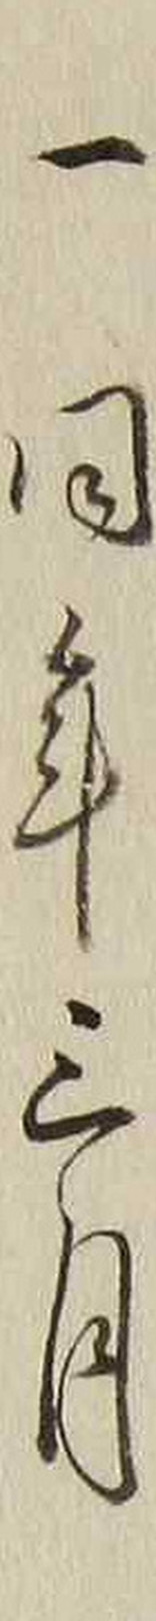一同年三月
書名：諸士系譜　巻之25　い之部25
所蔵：会津若松市立会津図書館
